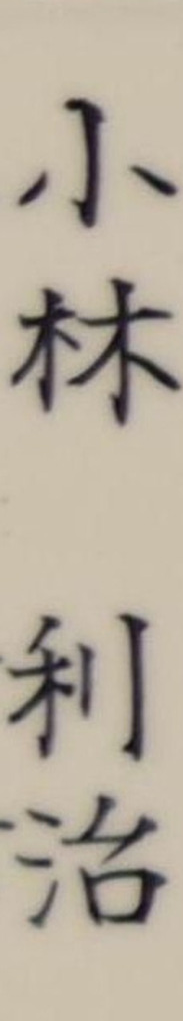小林利治
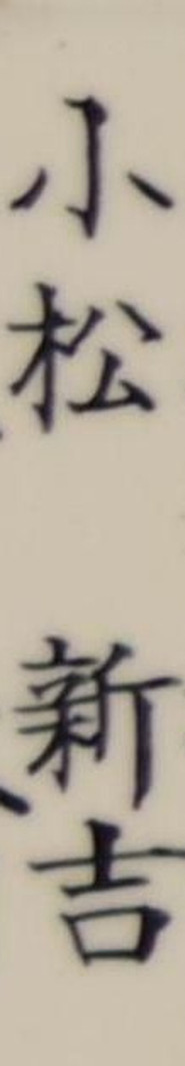小松新吉
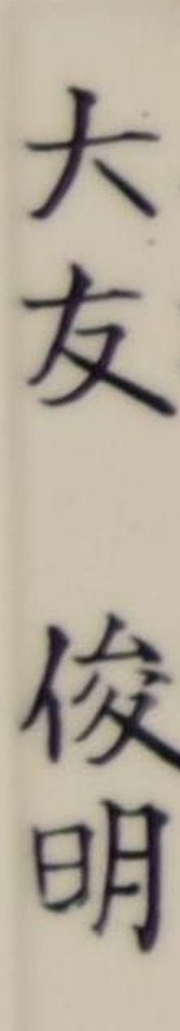大友俊明

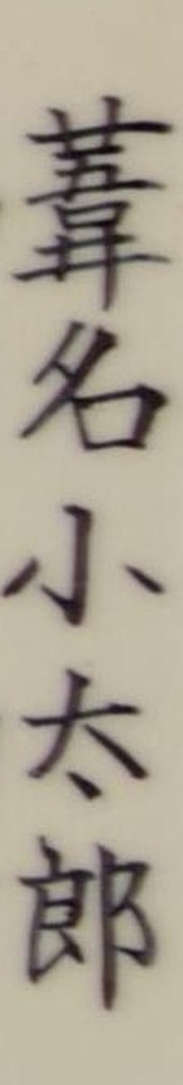葦名小太郎
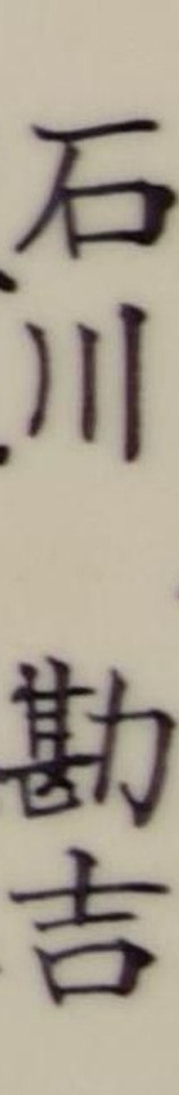石川勘吉
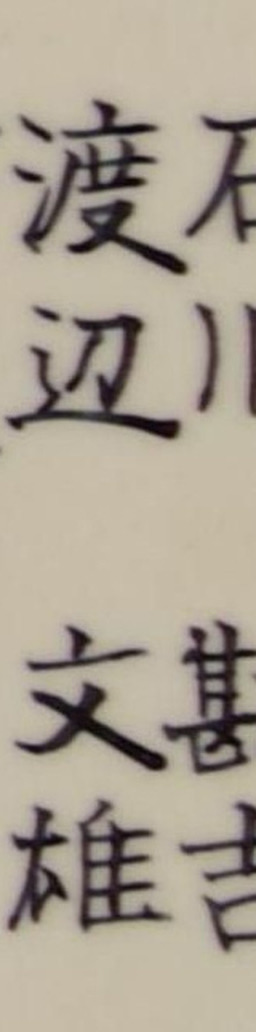渡辺文雄
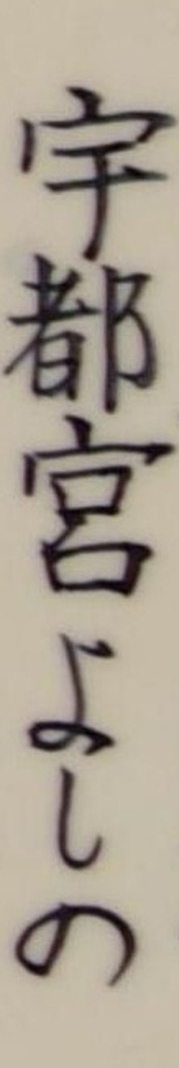宇都宮よしの
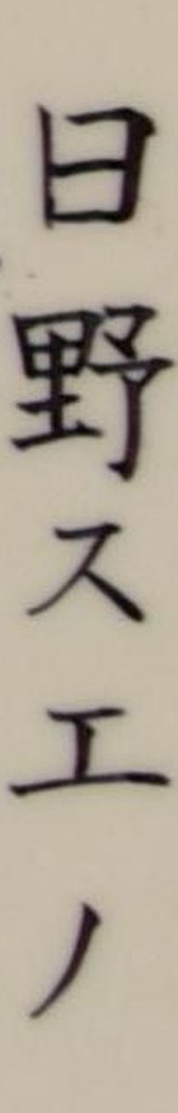日野スエノ
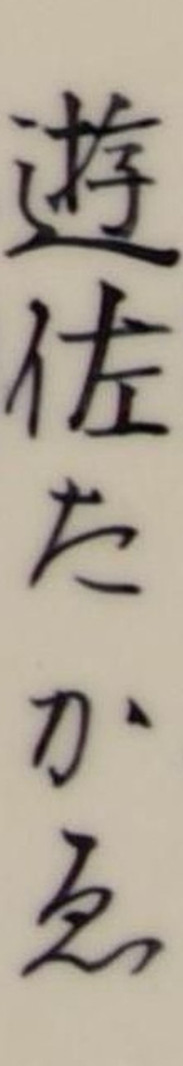遊佐たかえ
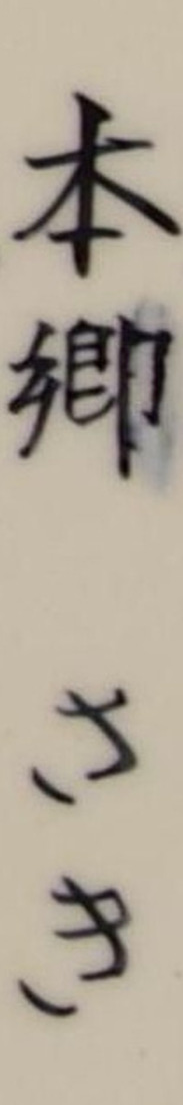本郷さき
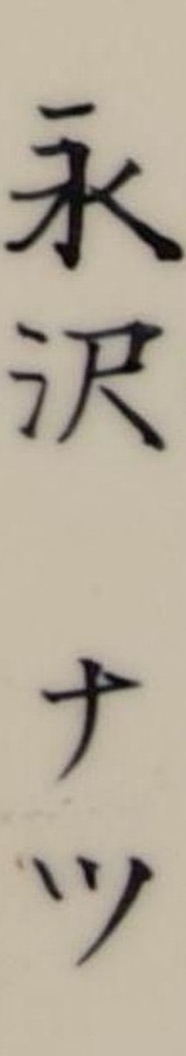永沢ナツ
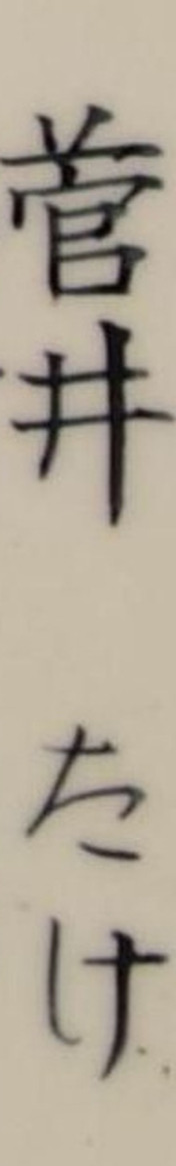菅井たけ
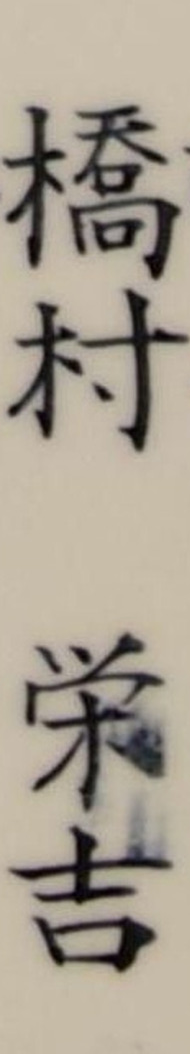橋村栄吉
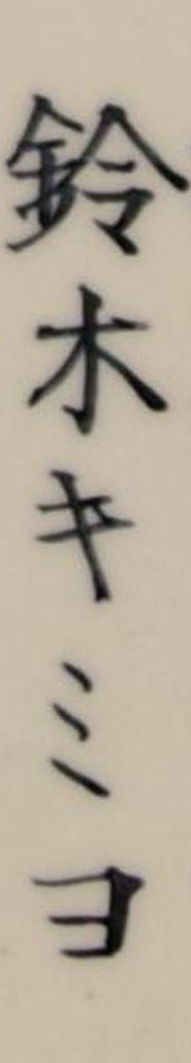鈴木キミヨ
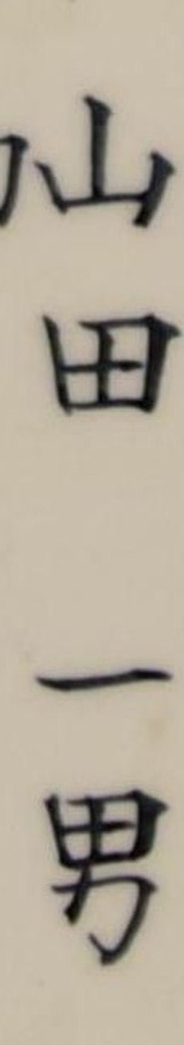山田一男
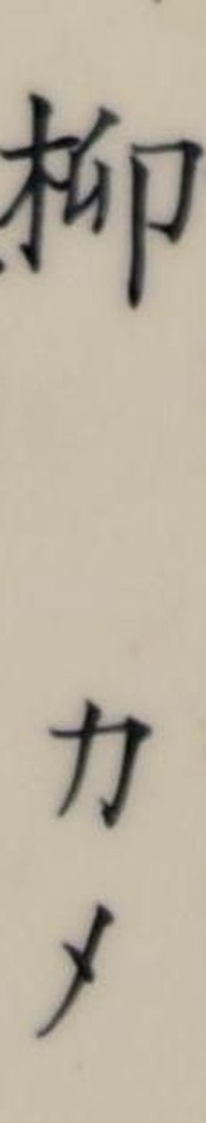柳カメ
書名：M~S
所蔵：高野山金剛峯寺
